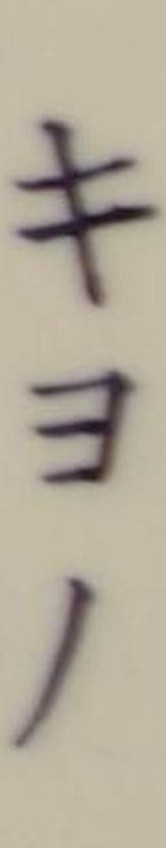キヨノ
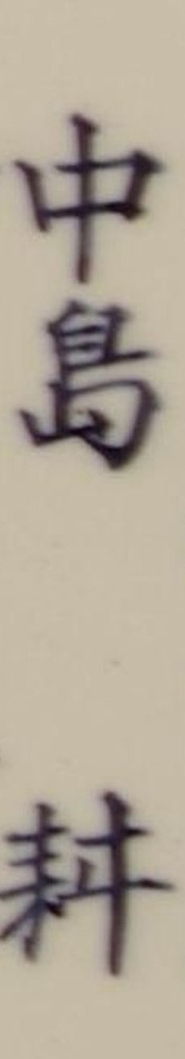中島耕
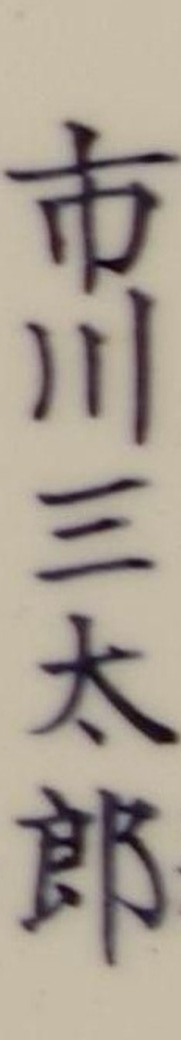市川三太郎
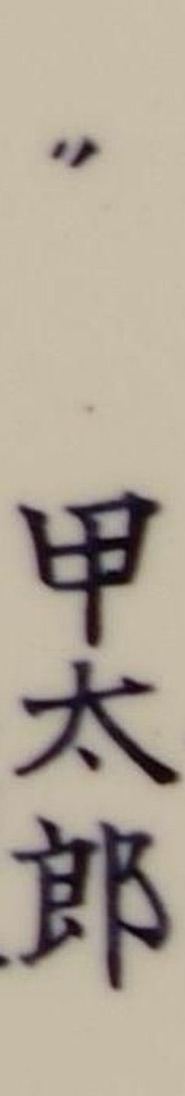甲太郎
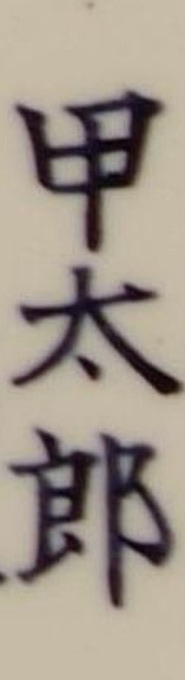甲太郎
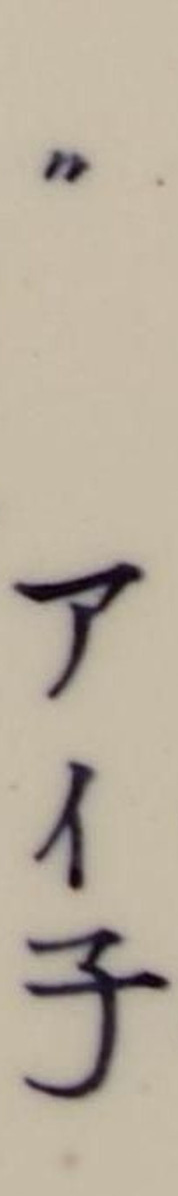アイ子
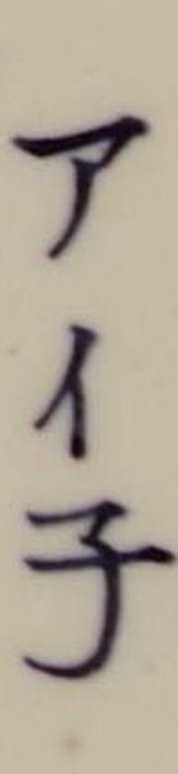アイ子
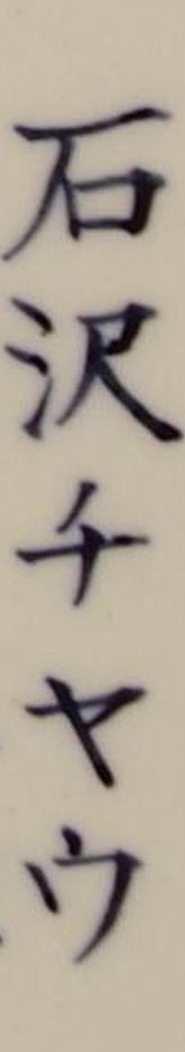石沢チヤウ
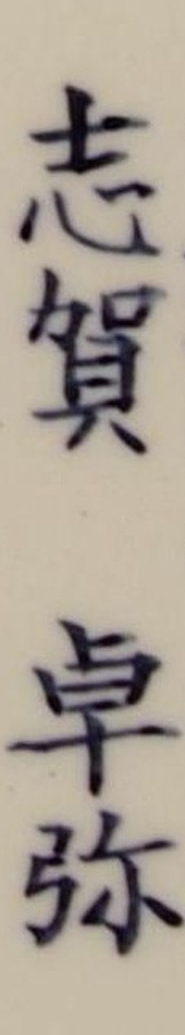志賀卓弥
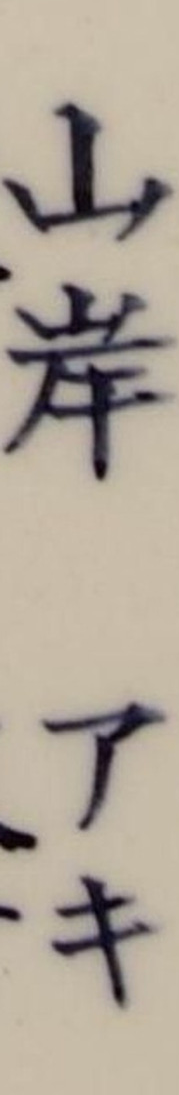山岸アキ
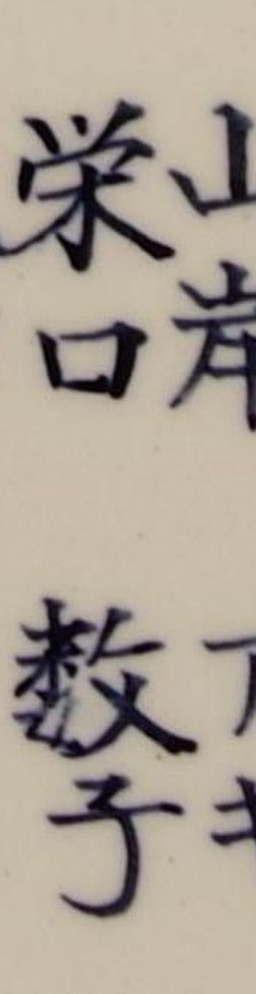栄口数子
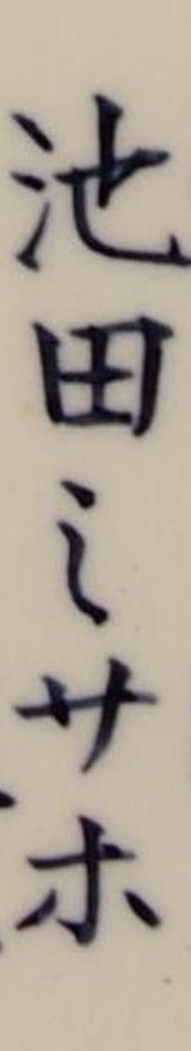池田之サホ
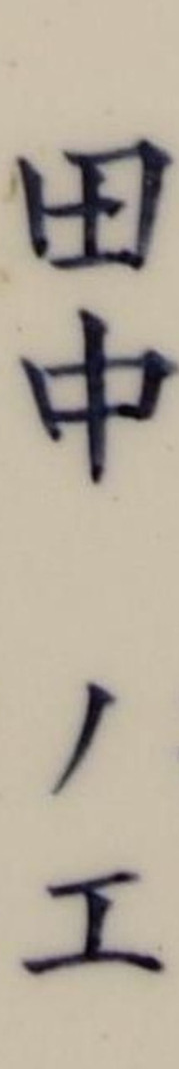田中ノ工
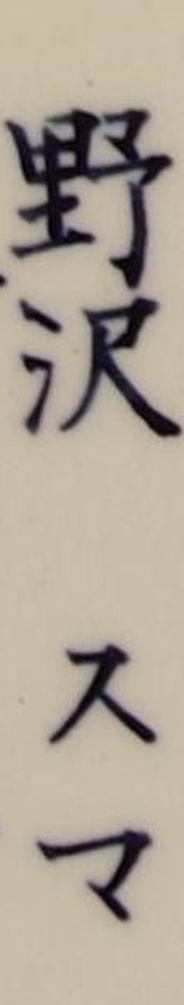野沢スマ
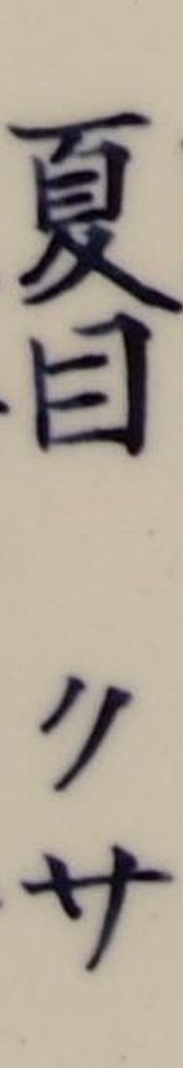夏目クサ
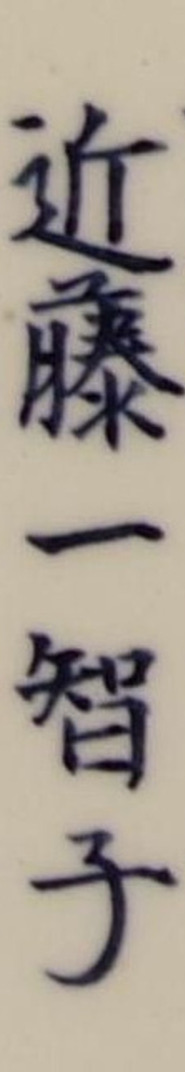近藤一智子
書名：E~L
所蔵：高野山金剛峯寺
